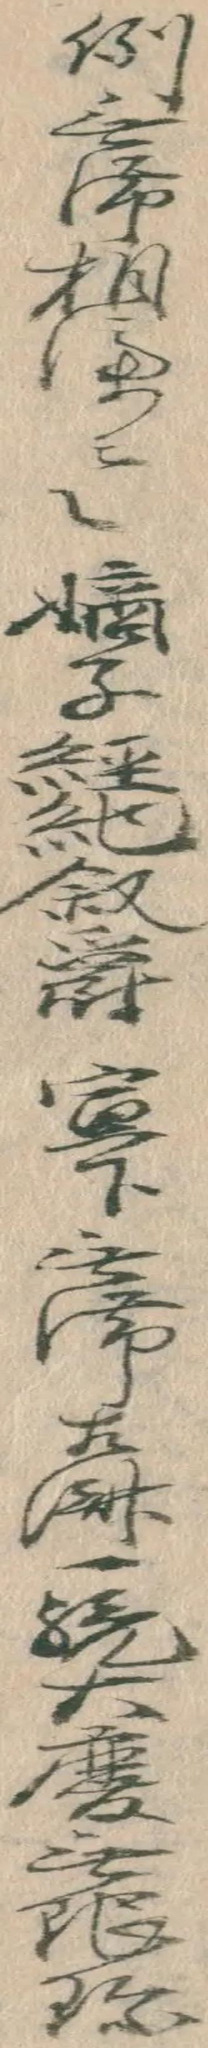例無滞相済ニ之嫡子紀叙爵宣下無帯相済一統大慶無限珎
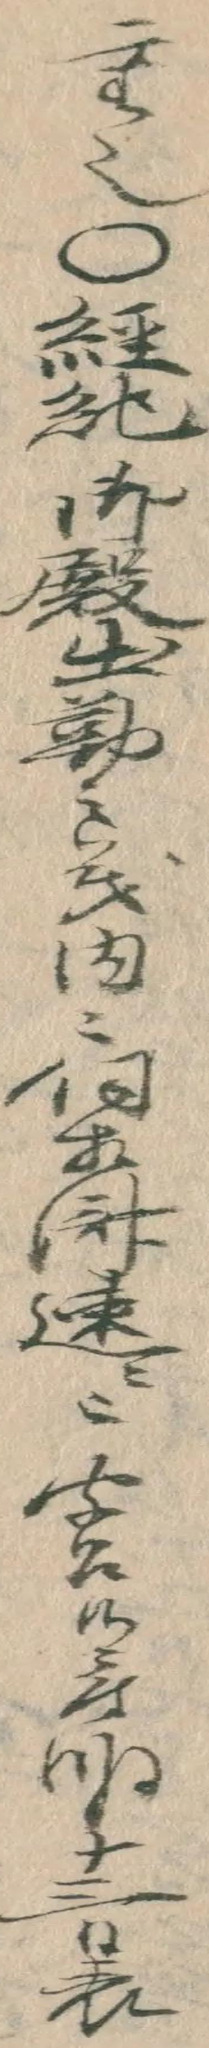重也○経紀御殿出勤之義内ニ伺相済速ニ被聞召候ニ付明十三日表
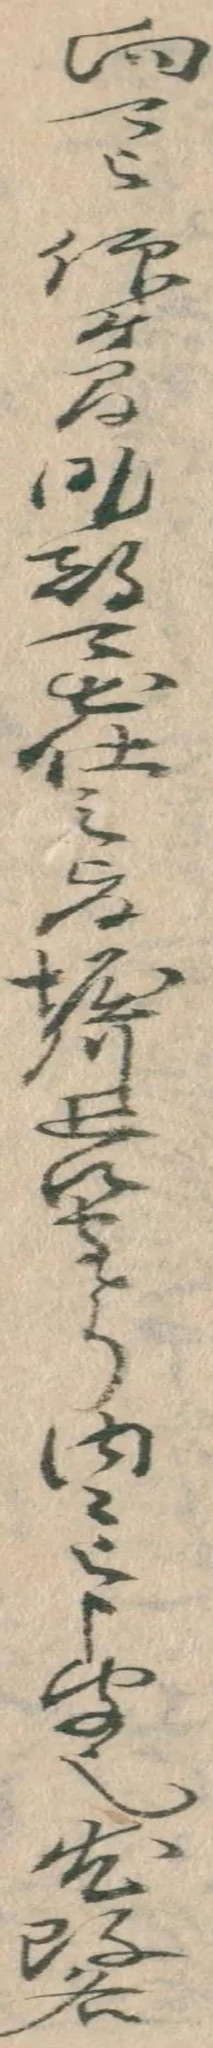向可被仰付間明都可出仕之旨堀川上左守より内々と申聞也尤改名
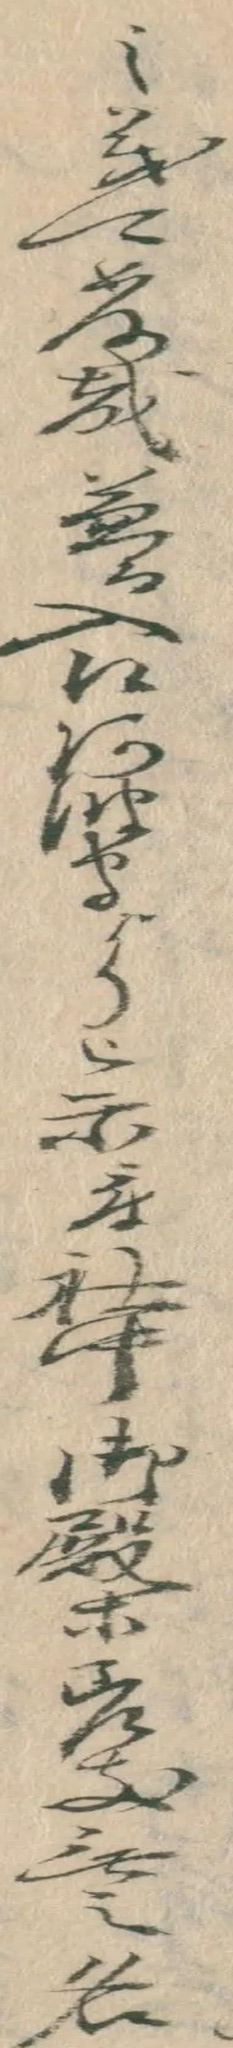之義可為哉兼而入口阿波守より被示付社中御殿等差支無之名
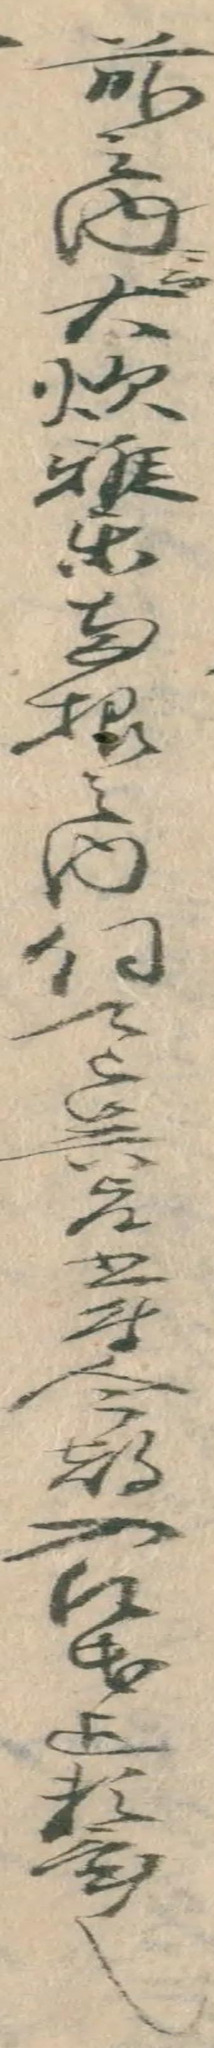前之内ゟ大炊雅楽両様之内伺可被呉旨書付今朝入江成迄頼置之
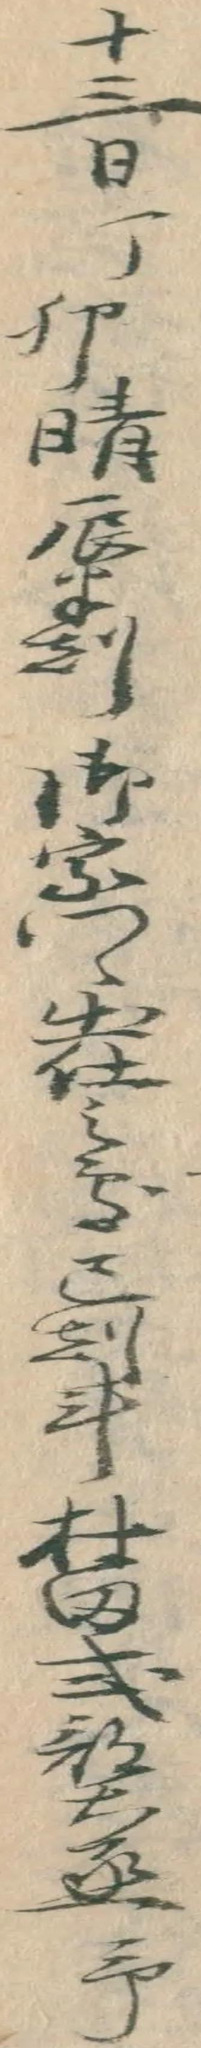十三日丁卯晴辰半刻御家門へ出仕之処巳刻斗村田式部大丞予

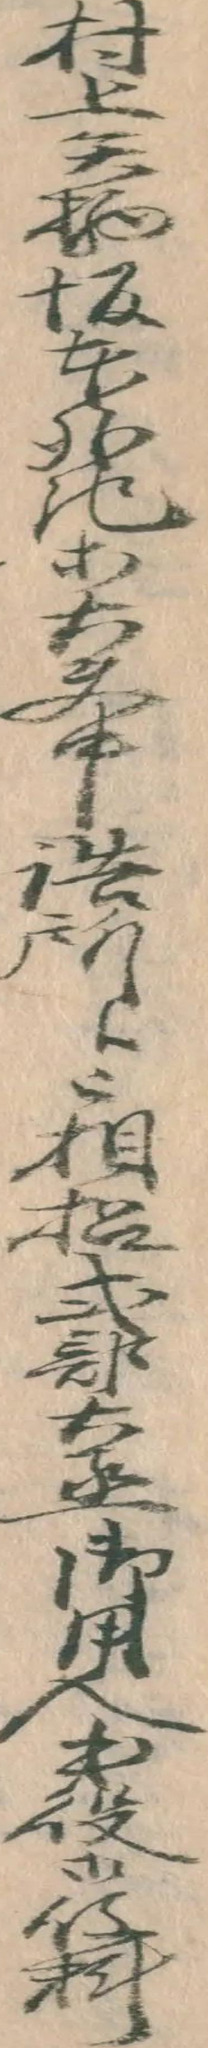村上矢柄坂本外記等大夫中詰所江被相招式部大丞御用人本役御役料
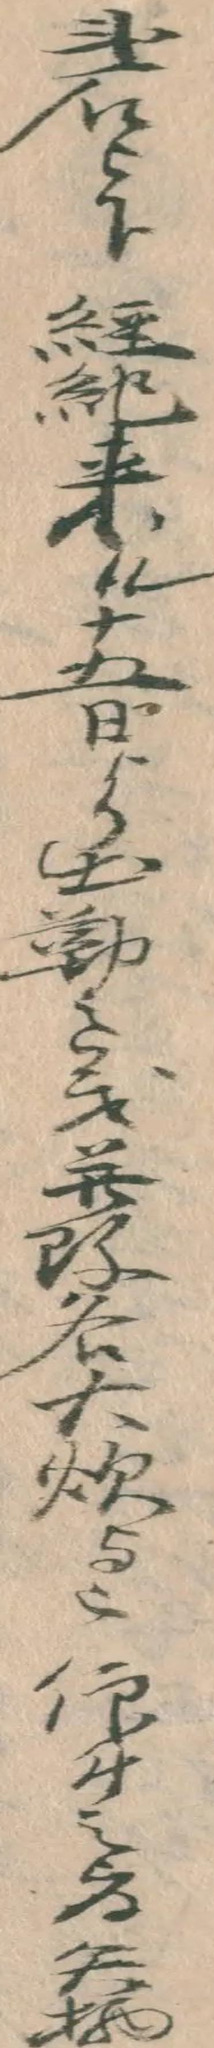弐石被下経紀来ル十五日より出勤之義并改名大炊と被仰付之旨矢柄
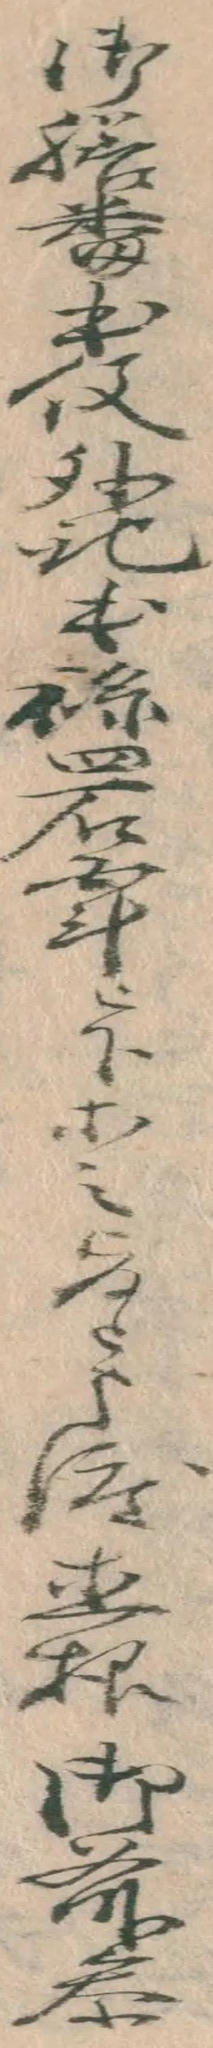御膳番本役外記本禄四石五斗被下等之旨被申渡直様御前参
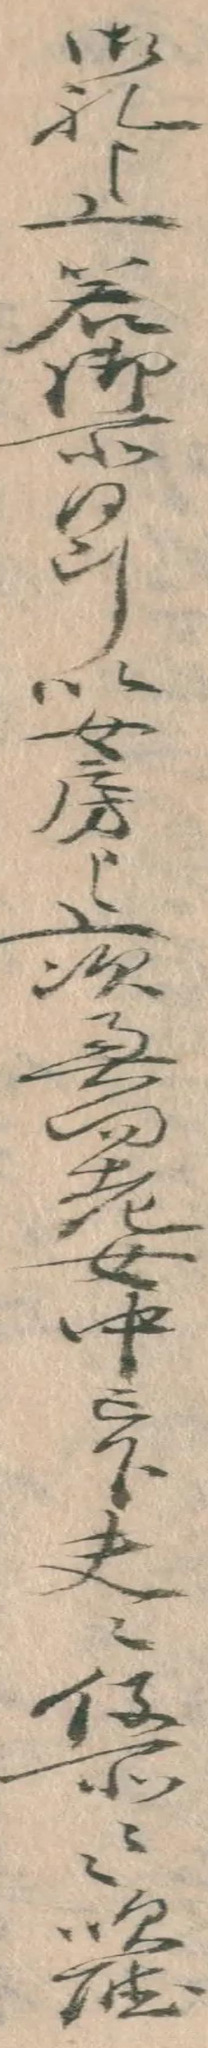御礼申上若御所同断以女房申上次奥向老女中被下夫々役所〻〻吹聴
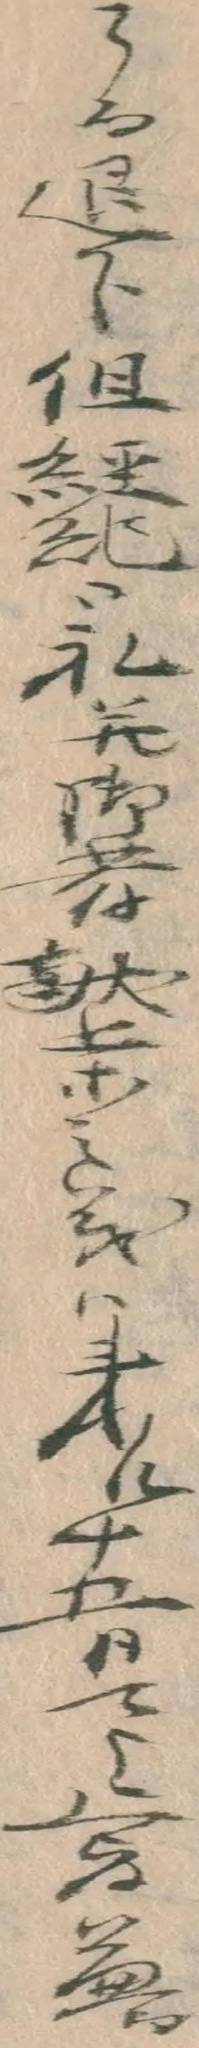了而退下但経紀御礼并御箸献上等之義ハ来ル十五日可申上旨兼而
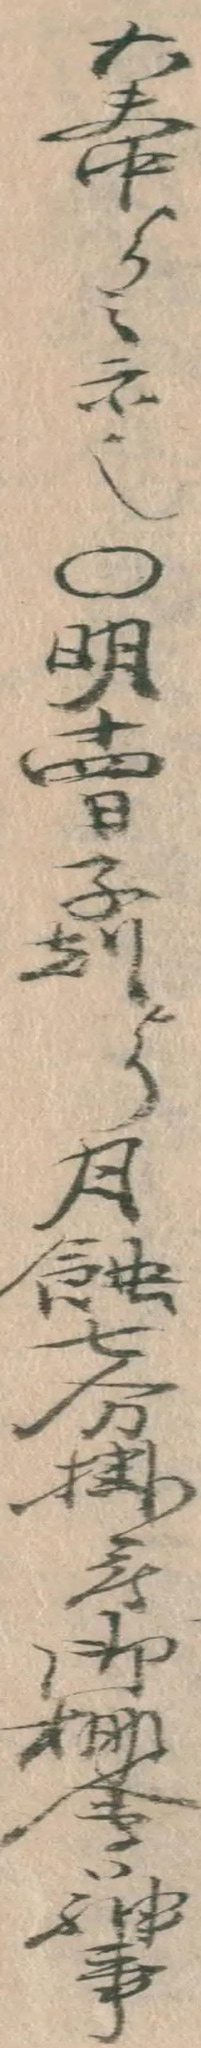大夫中より之所也○明十四日子刻より月蝕七分掛ニ付御棚會御神事
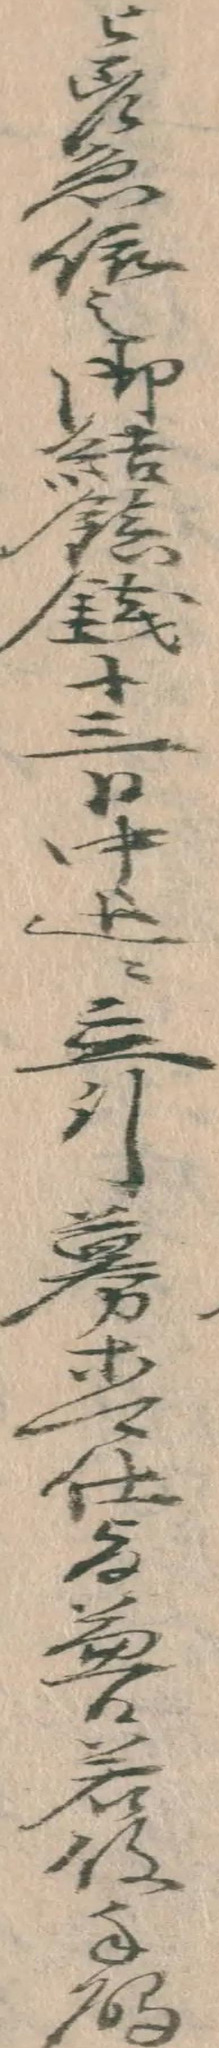被差急依之御結鎮銭十三日中迄に立引募等可仕旨兼日若役手触
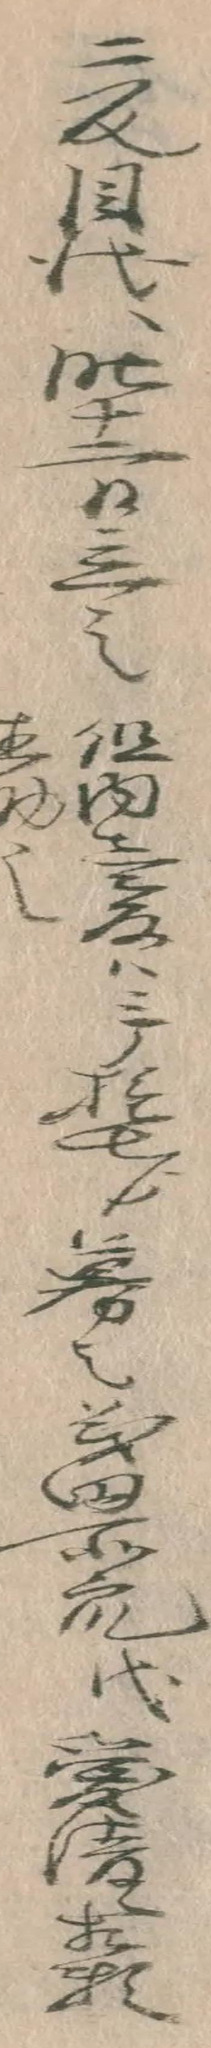二反目代へ昨十二日立之但内壱反ハ三ノゟ幕之義田所衆代愛清ニ相頼直助也
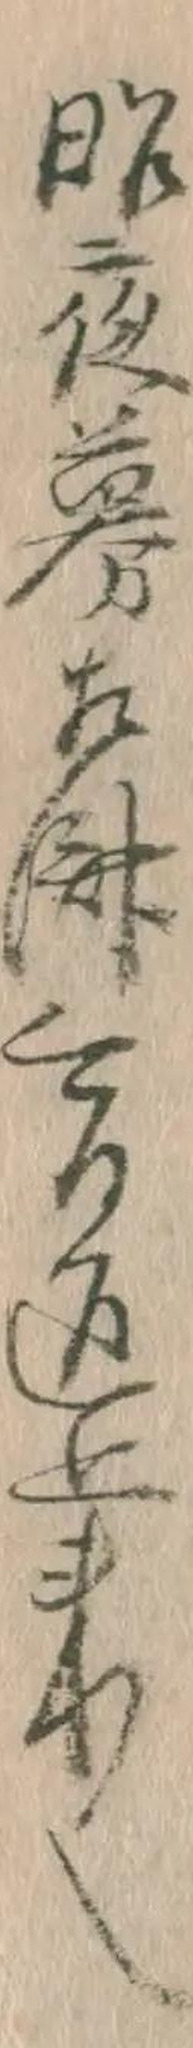昨夜募相済今日返上来之
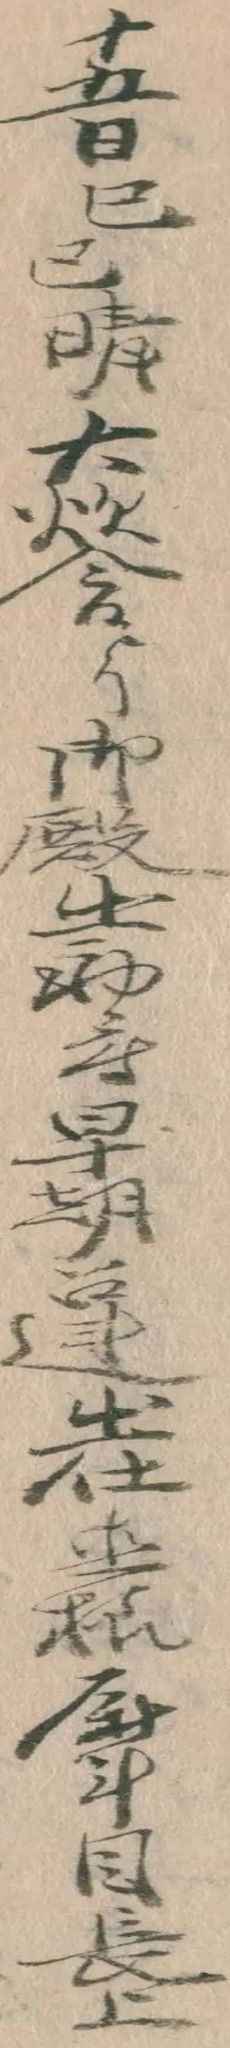十五日己巳晴大炊今日より御殿出勤ニ付早朝召連出仕直様熨斗目長上
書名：賀茂社記録. 第66冊
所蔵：国立国会図書館 National Diet Library, JAPAN
